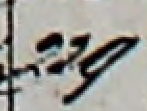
229
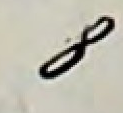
8
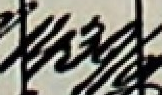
1439/g
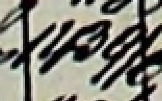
1439/?
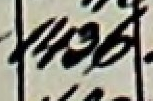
1436
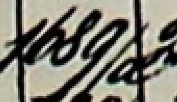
1689/a
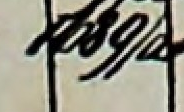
1689/a
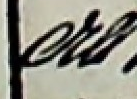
Alt
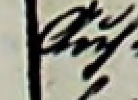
Aus„
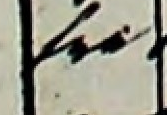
see
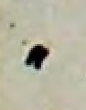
„
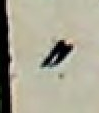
„
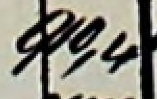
910,4
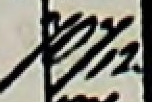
707,2
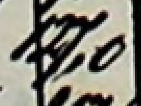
127,0
